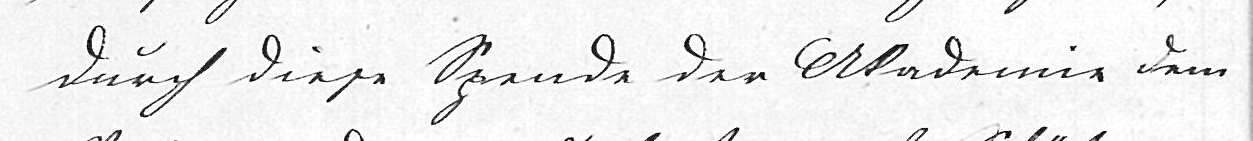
durch diese Spende der Akademie dem
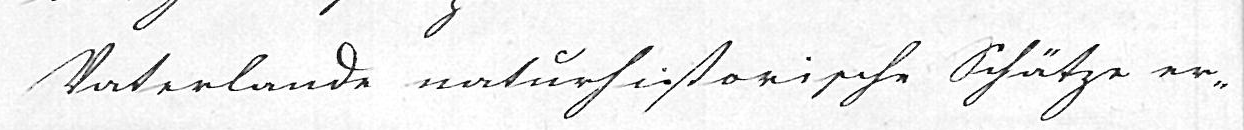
Vaterlande naturhistorische Schätze er-
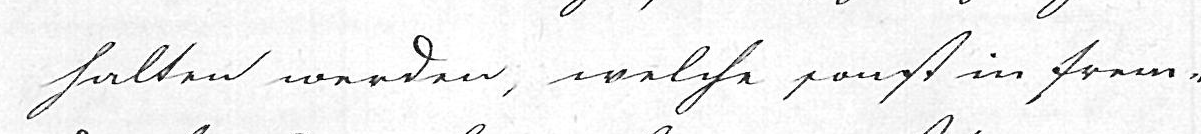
halten werden welche sonst in frem-
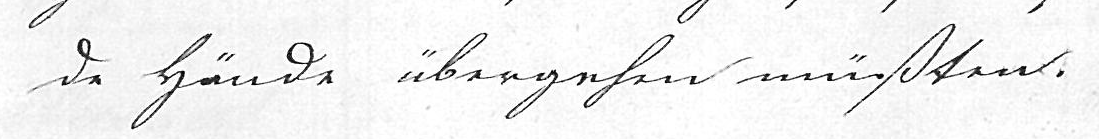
de Hände übergehen müßten.
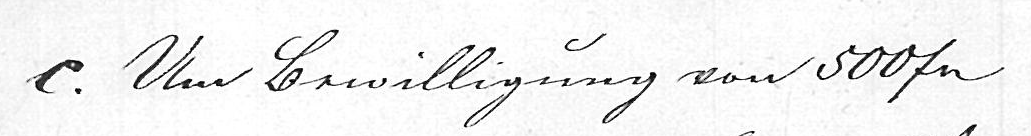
c. Um Bewilligung von 500 fr
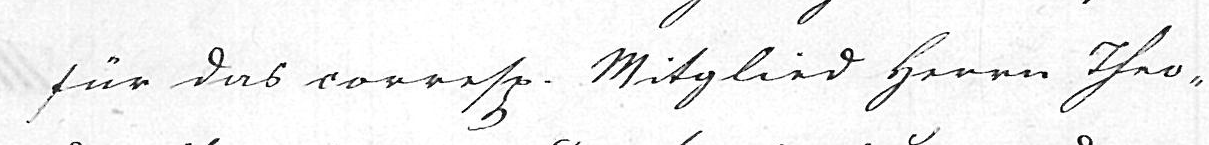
für das corresp. Mitglied Herrn Theo-
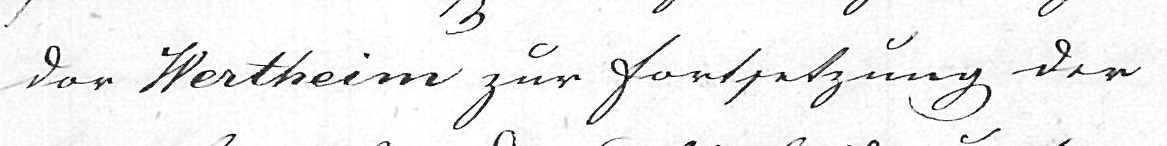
dor Wertheim zur Fortsetzung der
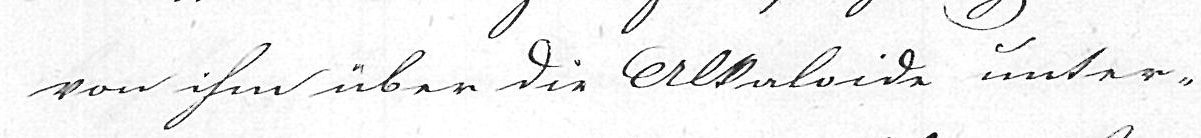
von ihm über die Alkaloide unter-
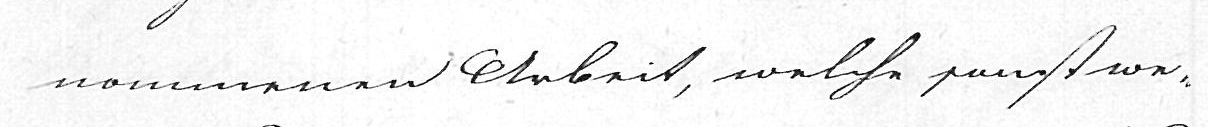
nommenen Arbeit, welche sonst we-
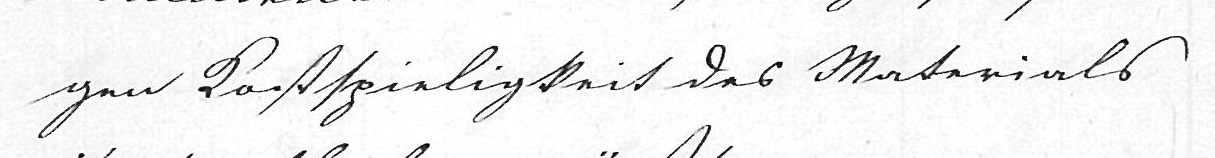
gen Kostspieligkeit des Materials
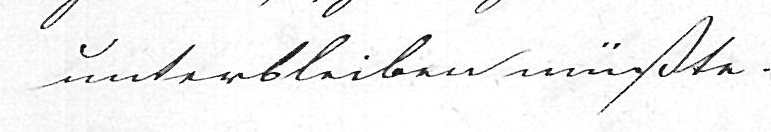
unterbleiben müßte.
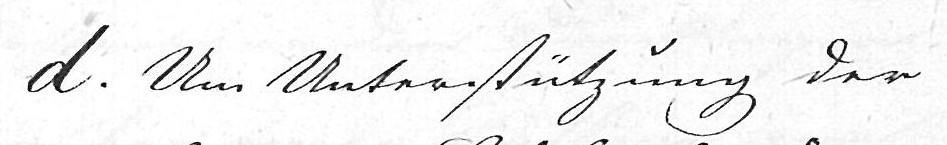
d. Um Unterstützung der
